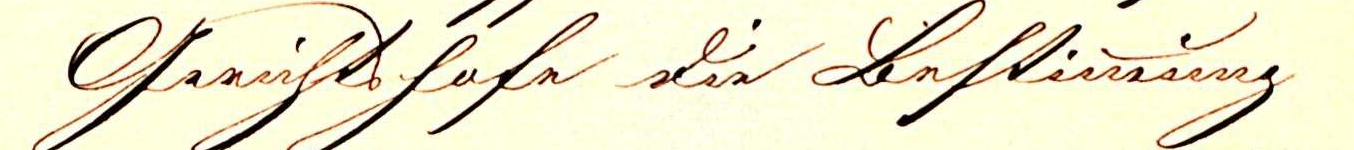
Gerichtshofe die Bestimmung
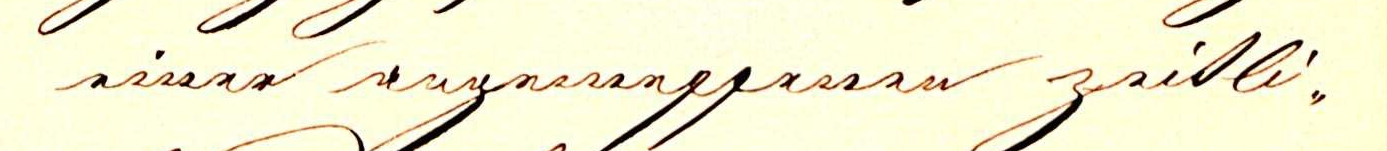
einer angemessenen zeitli¬
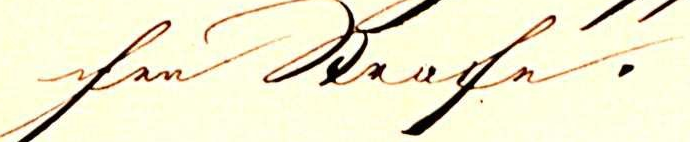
chen Strafe.
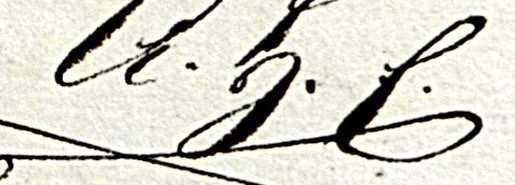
A. H. E.
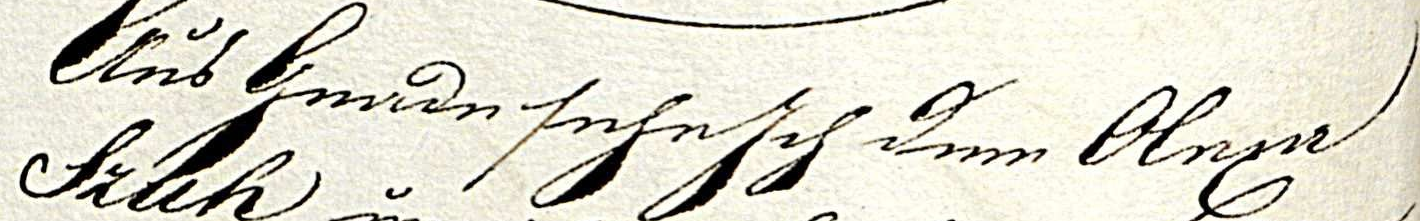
Aus Gnade sehe Jch dem Olexa
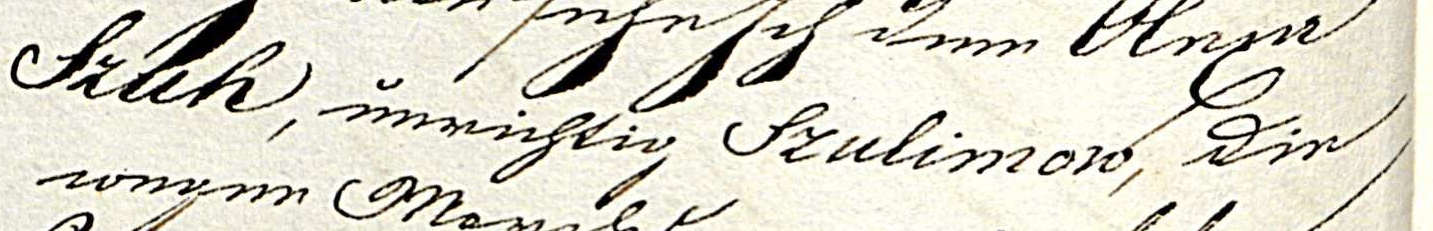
Szuh, unrichtig Szulimow, die
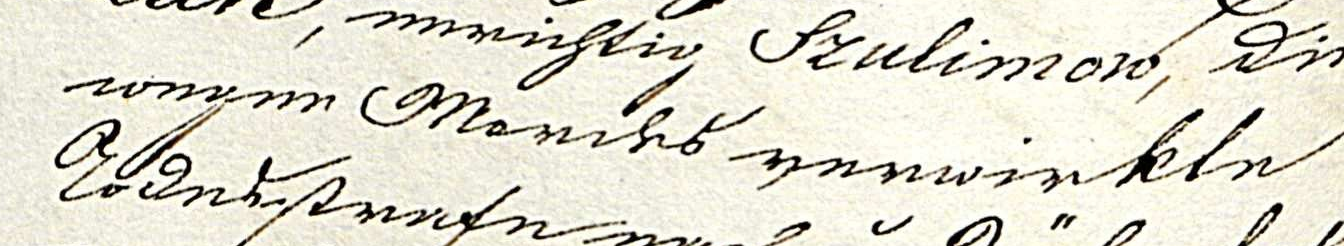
wegen Mordes verwirkte
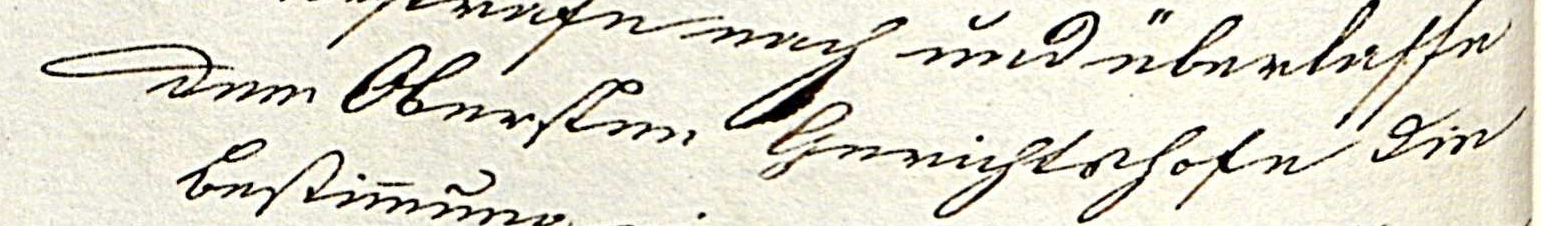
dem obersten Gerichtshofe die
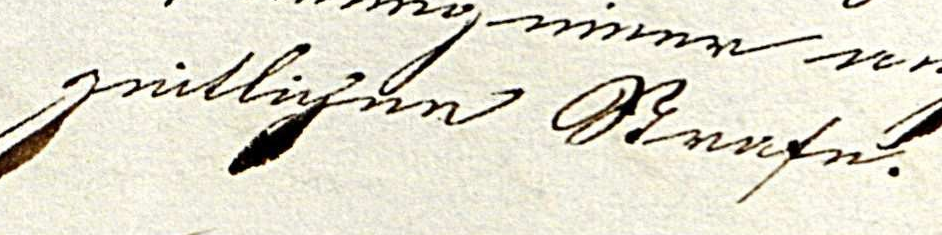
zeitlichen Strafe.
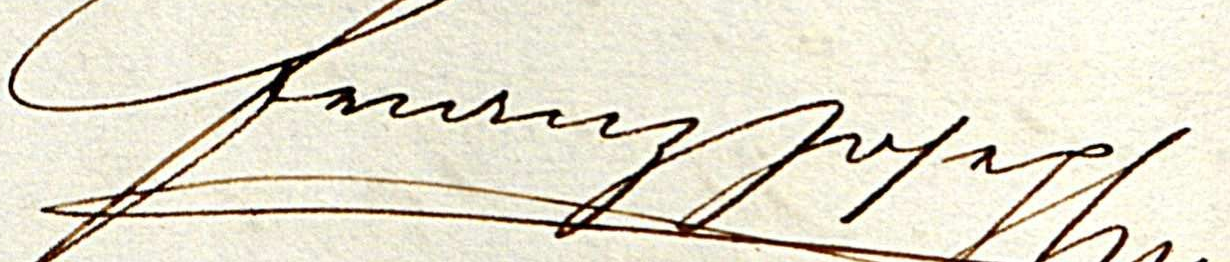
Franz Joseph
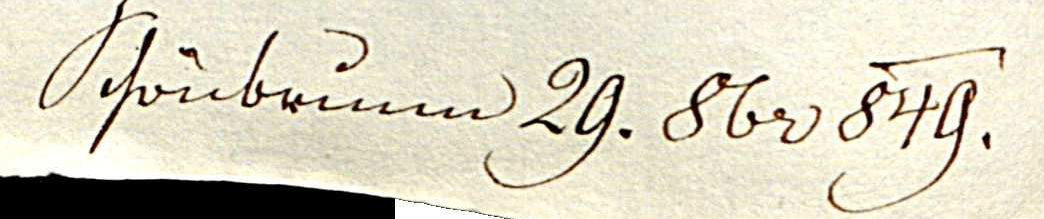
Schönbrunn 29. 8br 849.
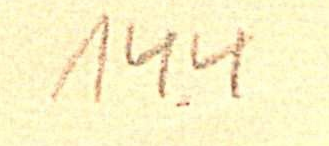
144
